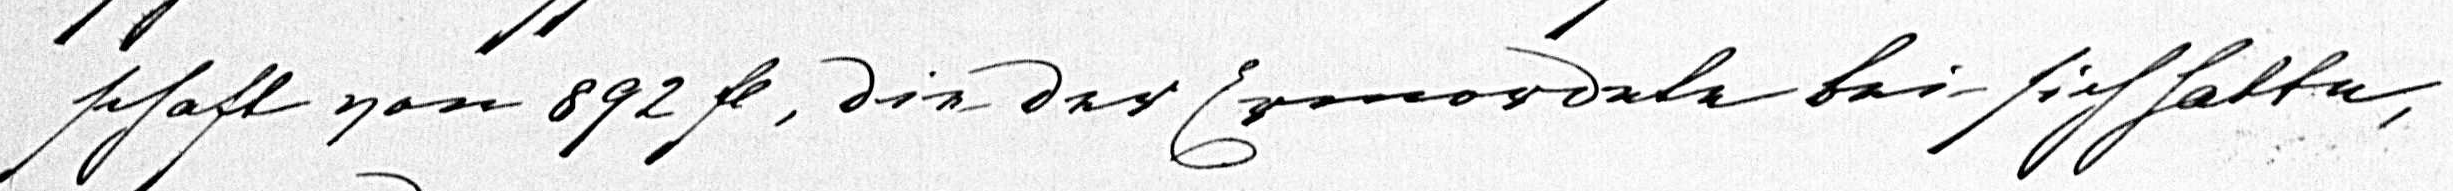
schaft von 892 fl die der Ermordete bei sich hatte,
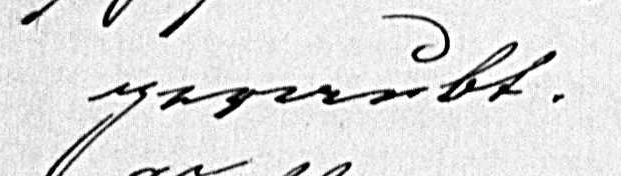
geraubt.
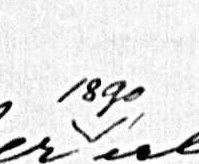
1890
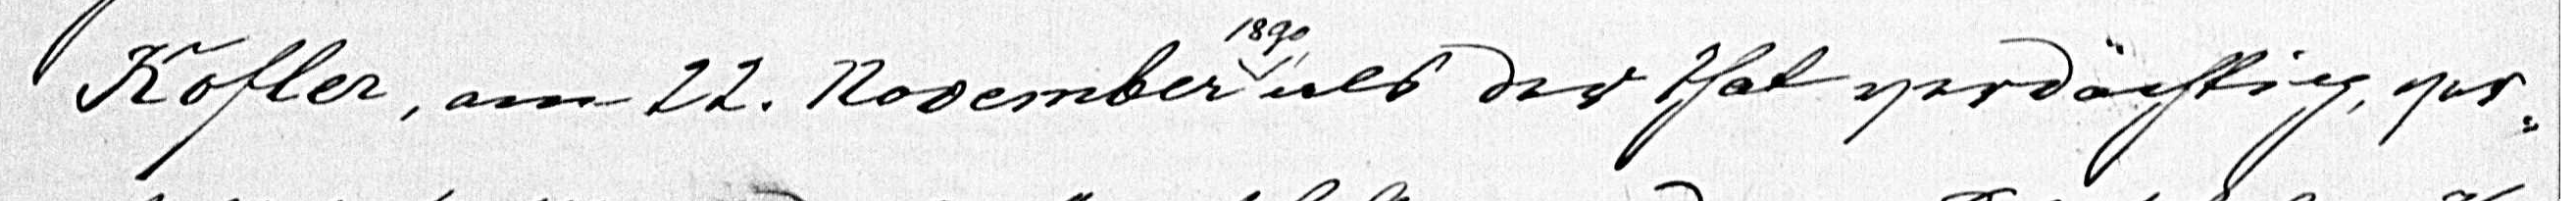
Kofler, am 22. November als der That verdächtig, ver¬
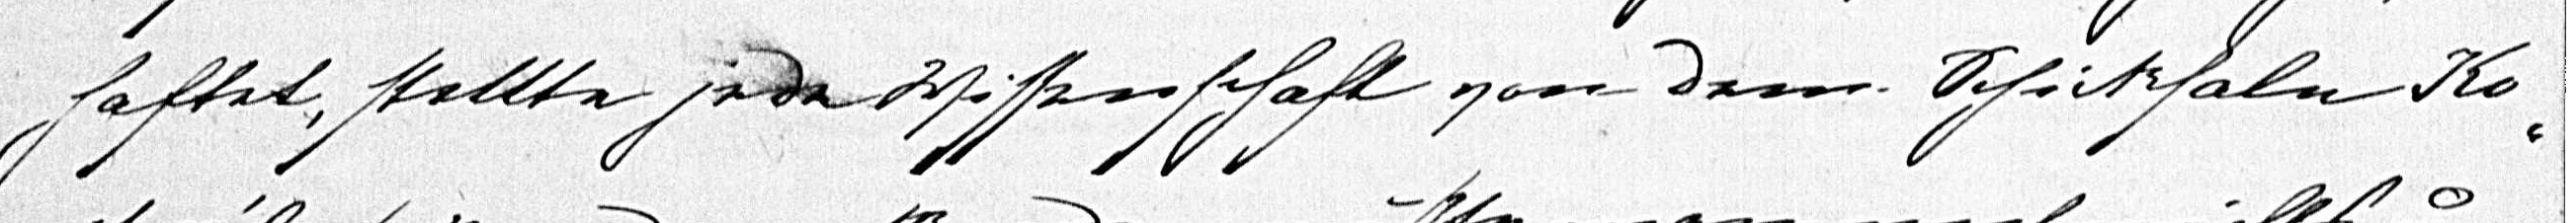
haftet, stellte jede Wissenschaft von dem Schicksale Ko¬
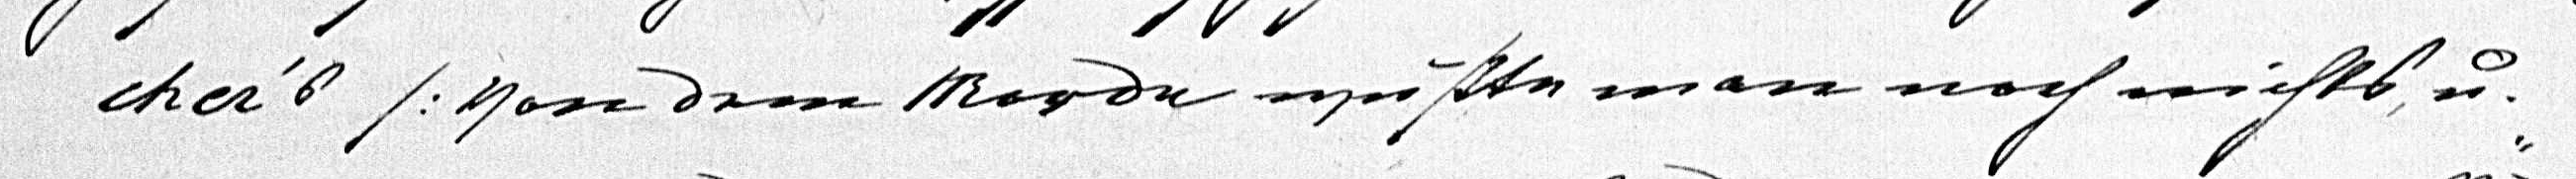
cher’s (von dem Morde wußte man noch nichts u.
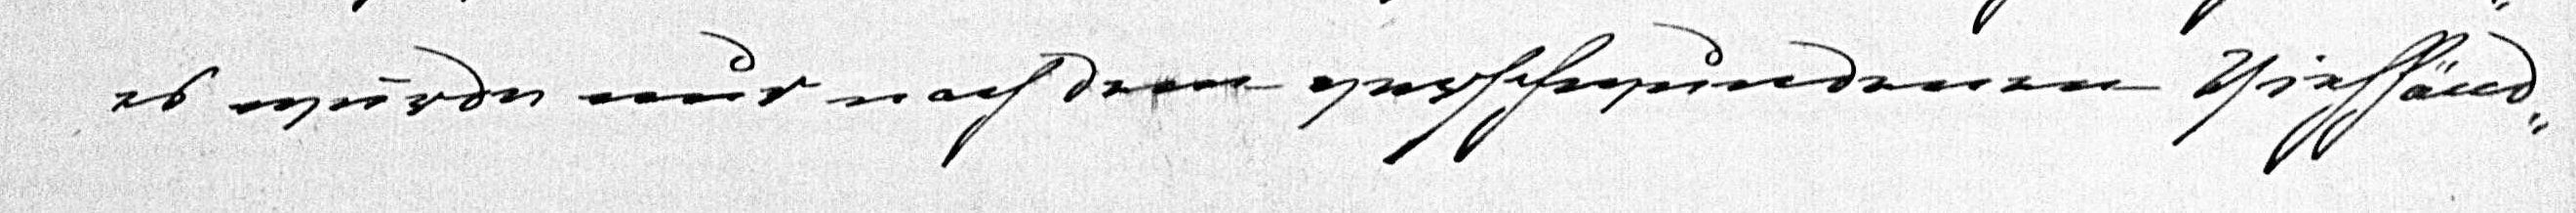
es wurde nur nach dem verschwundenen Viehhänd¬
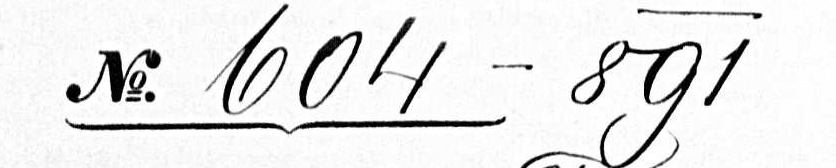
No. 604 – 1891
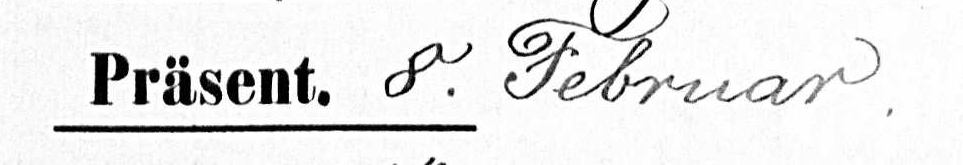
Präsent. 8. Februar
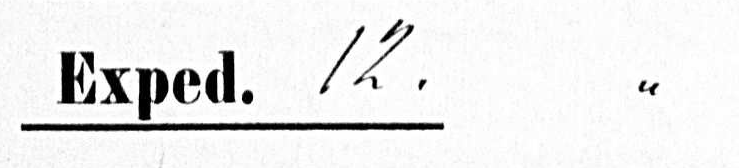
Expedit 12. Februar
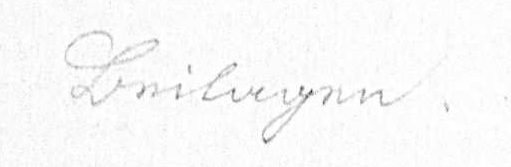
Beilagen
